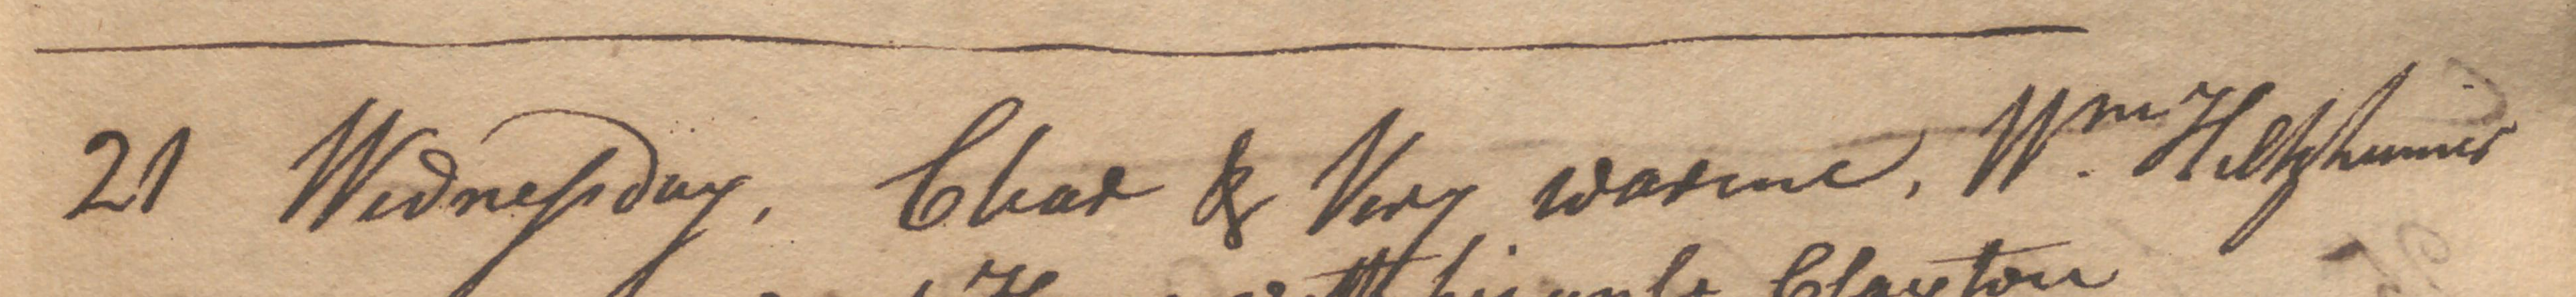21 Wednesiday. Clear & Vay warme, W^m. Hiltzheimer
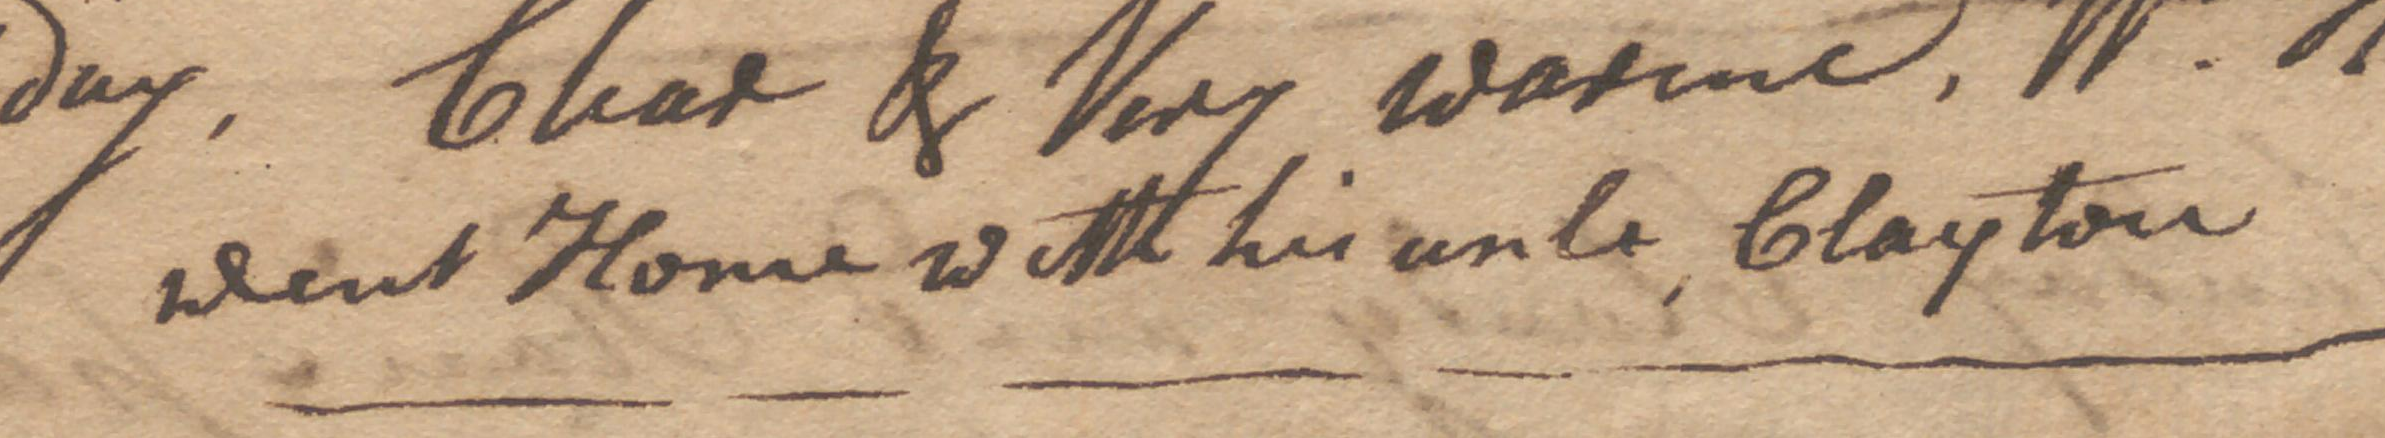went Home with his uncle, Clayton
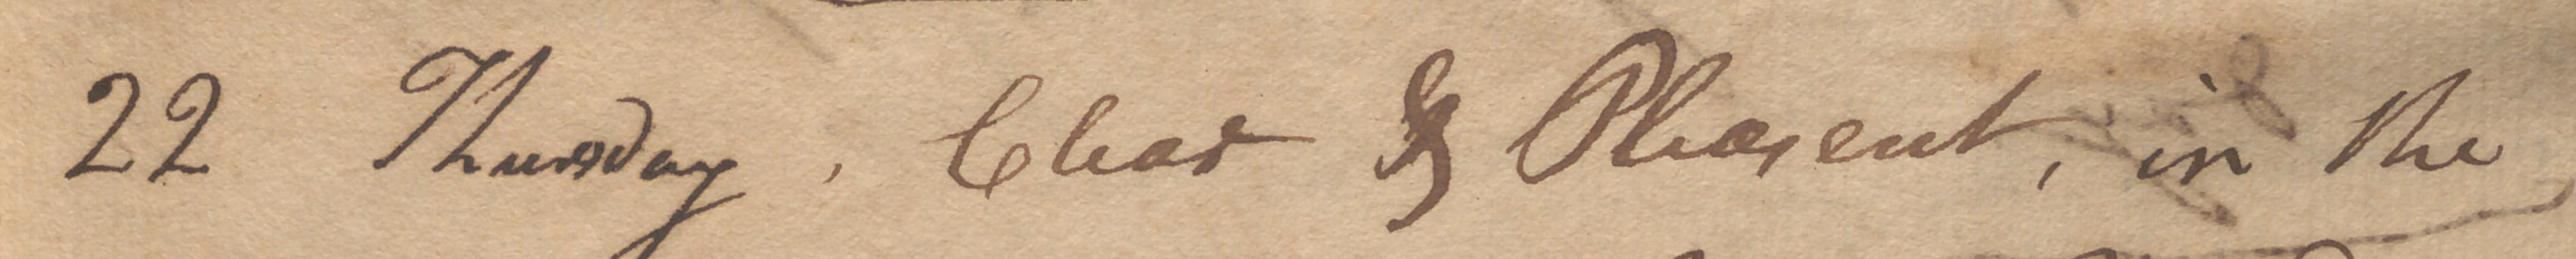22 Thursday. Clear & Pleasent, in the
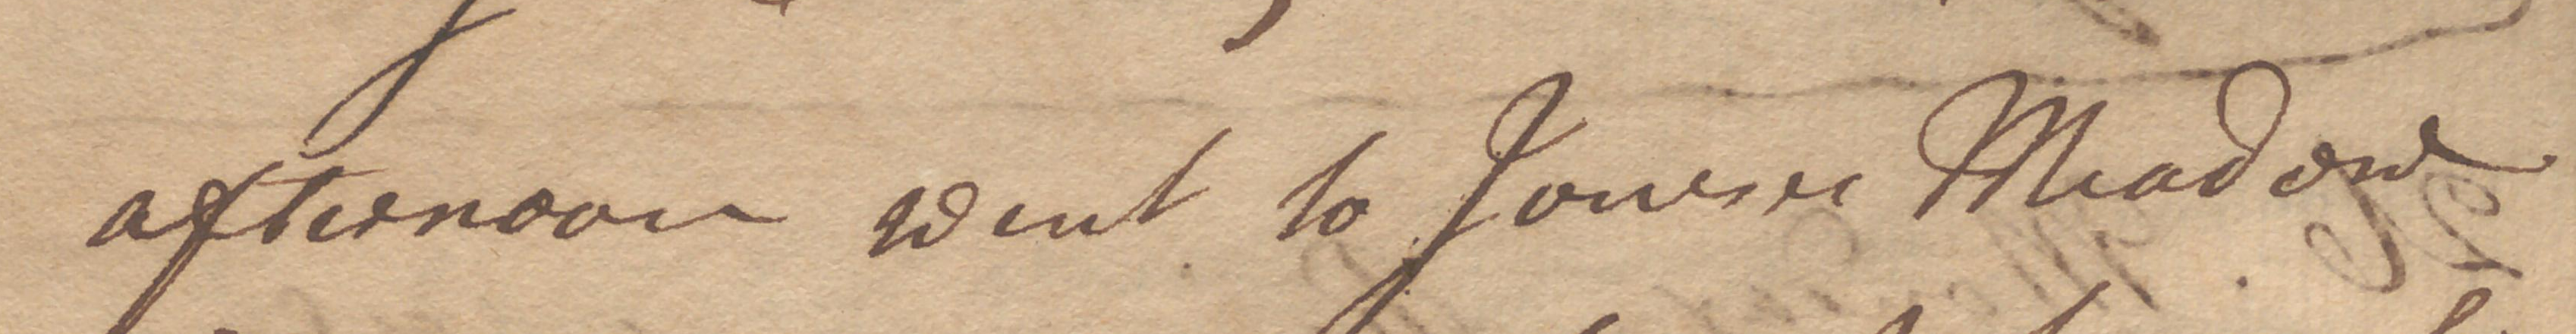afternoon went to Joneses Meadow
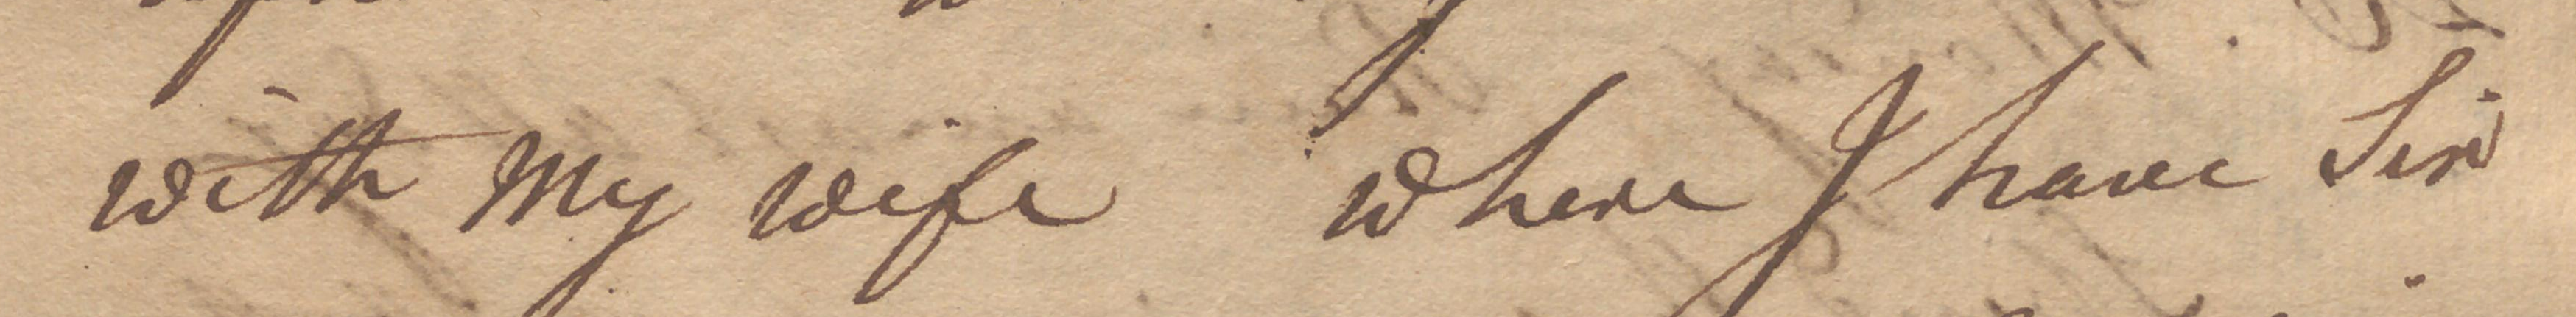with my wife where I have Six
